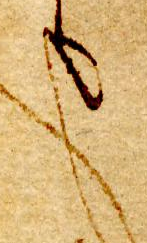To
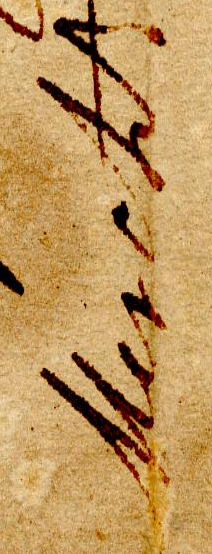Merch^t
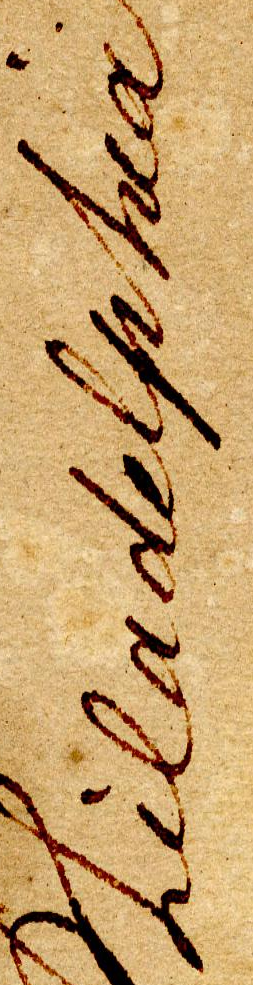Philadelphia
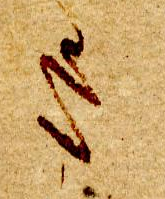In
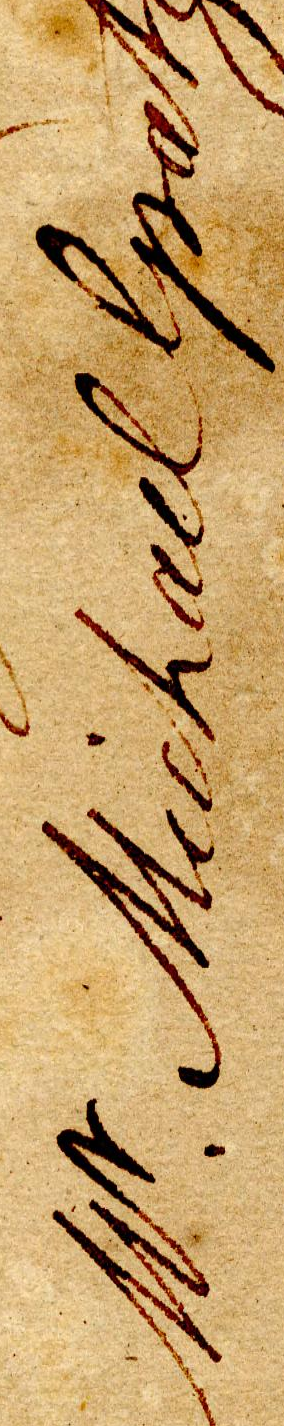M^r Michael Gratz
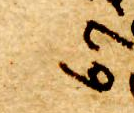672
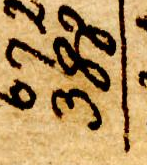388
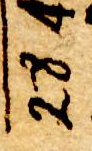284
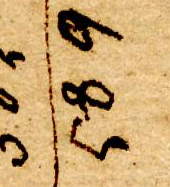589
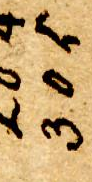305
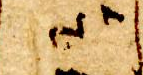7
